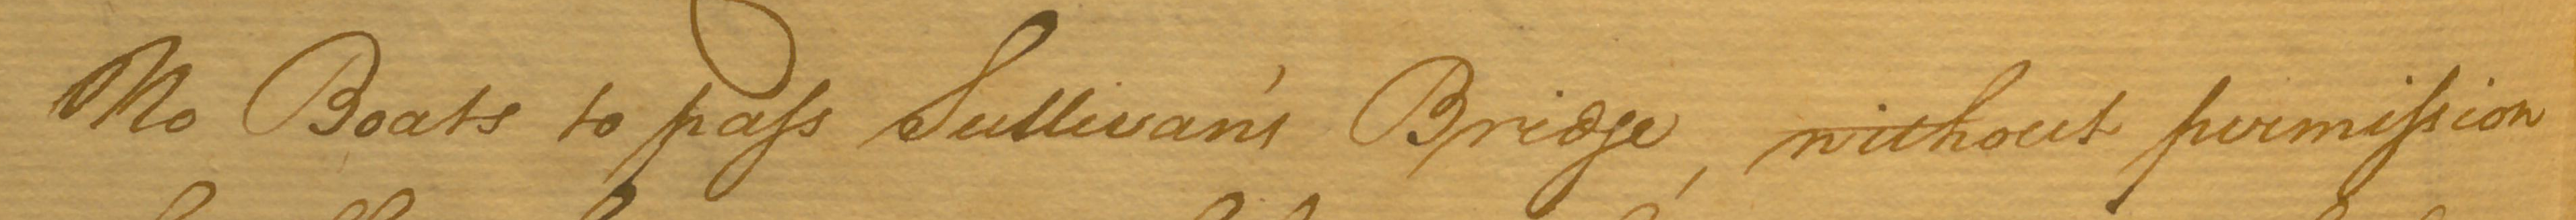No Boats to pass Sullivan's Bridge, without permission
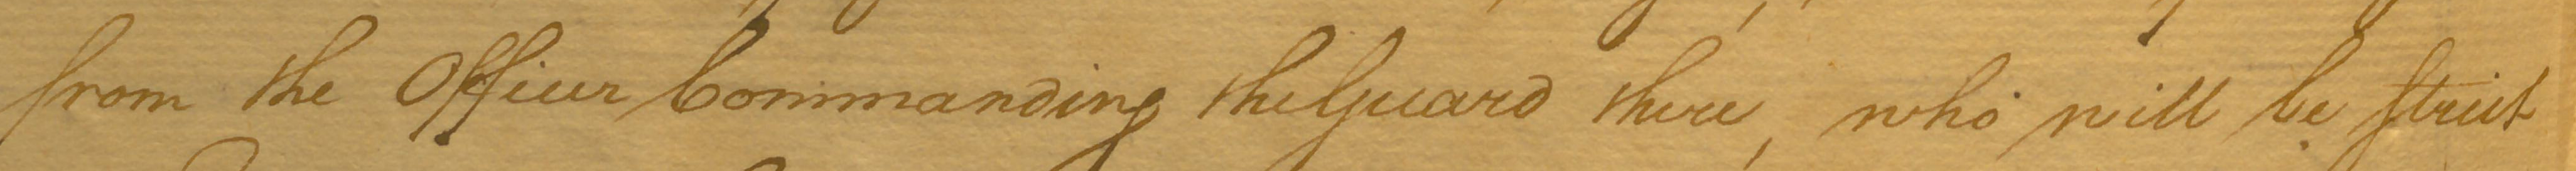from the Officer Commanding the Guard there, who will be strict
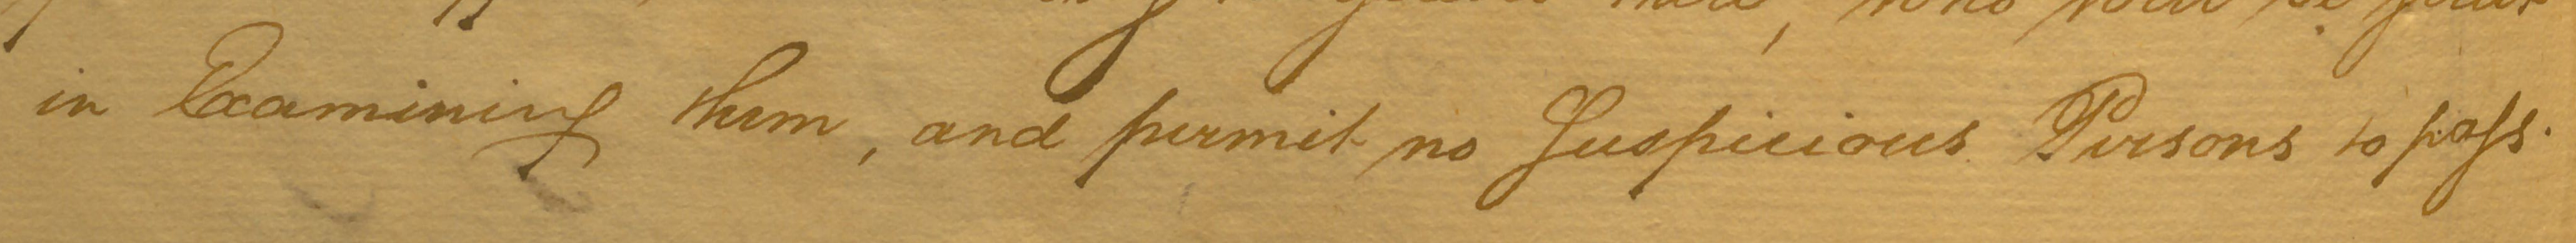in Examining them, and permit no suspicious Persons to pass.
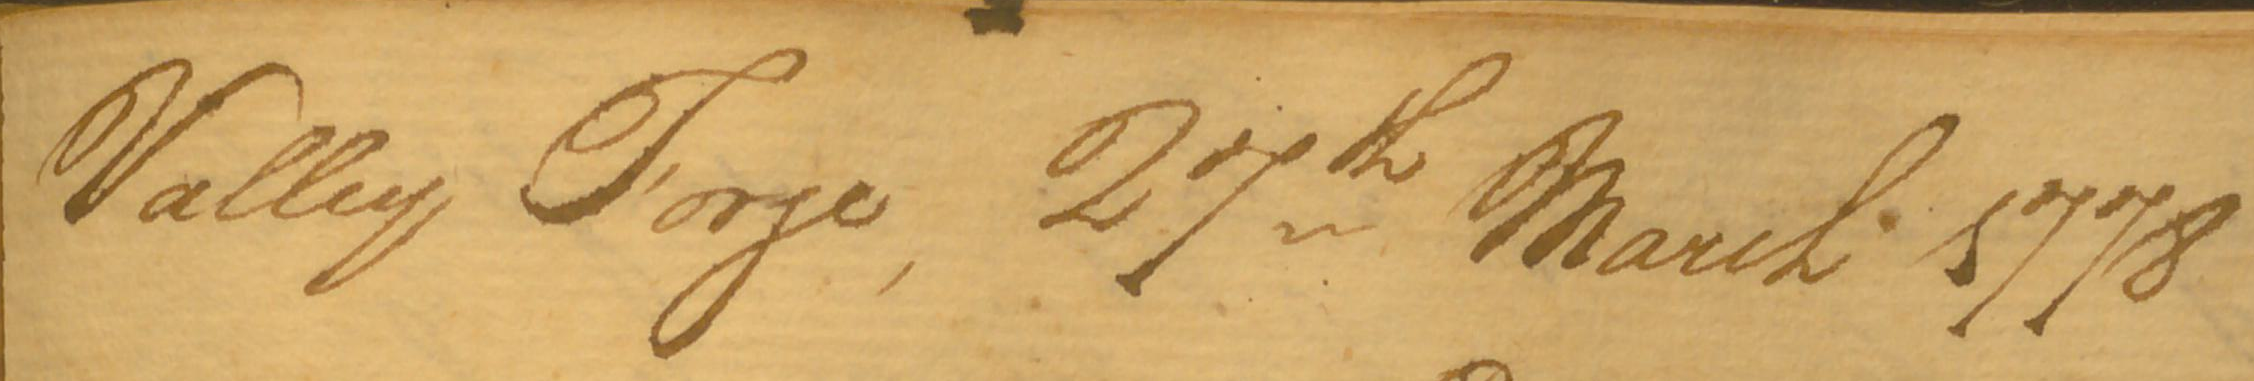Valley Forge, 27^th March 1778
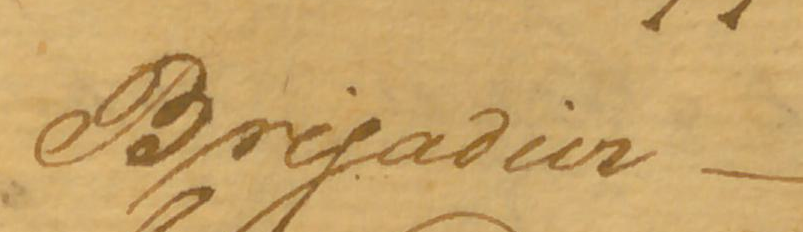Brigadier-
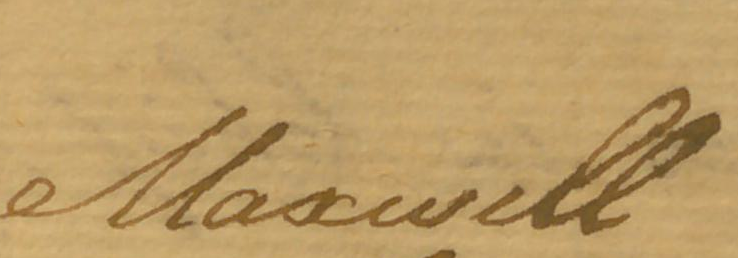Maxwell
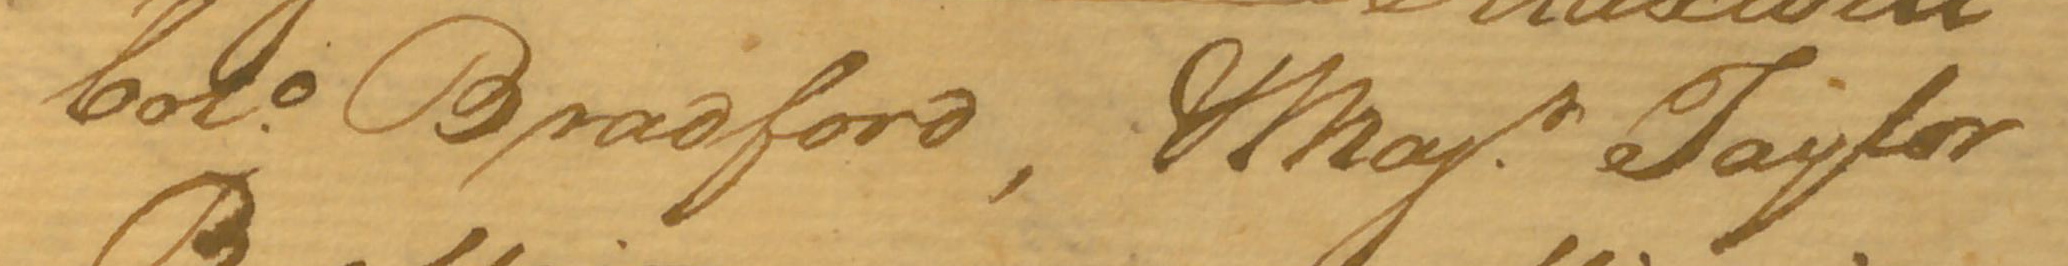Col^o. Bradford, & Maj^r. Taylor
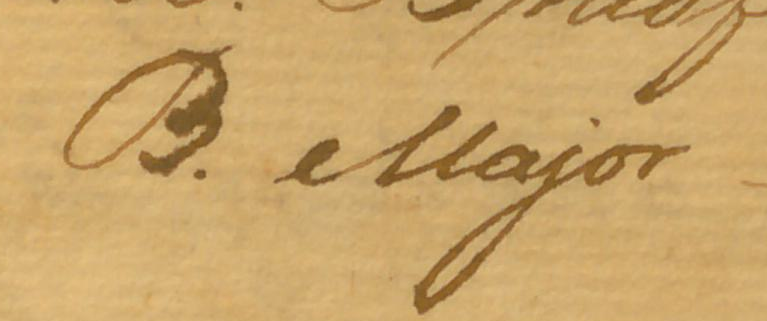B. Major
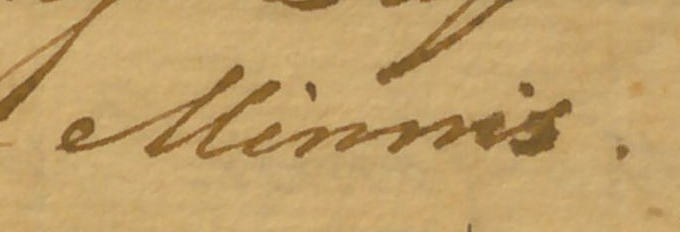Minnis.
